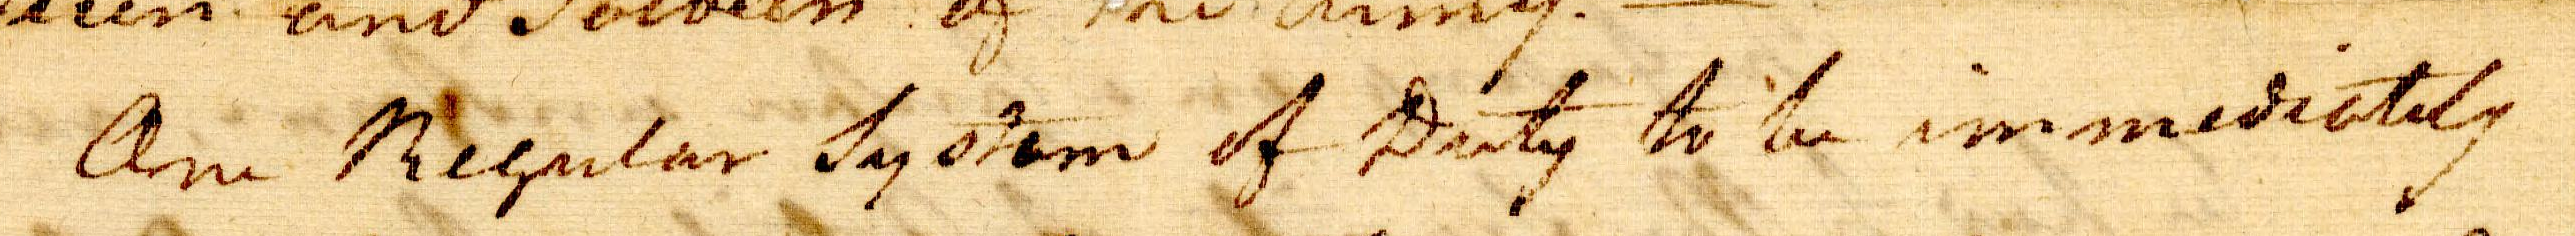One Regular System of Duty to be immediately
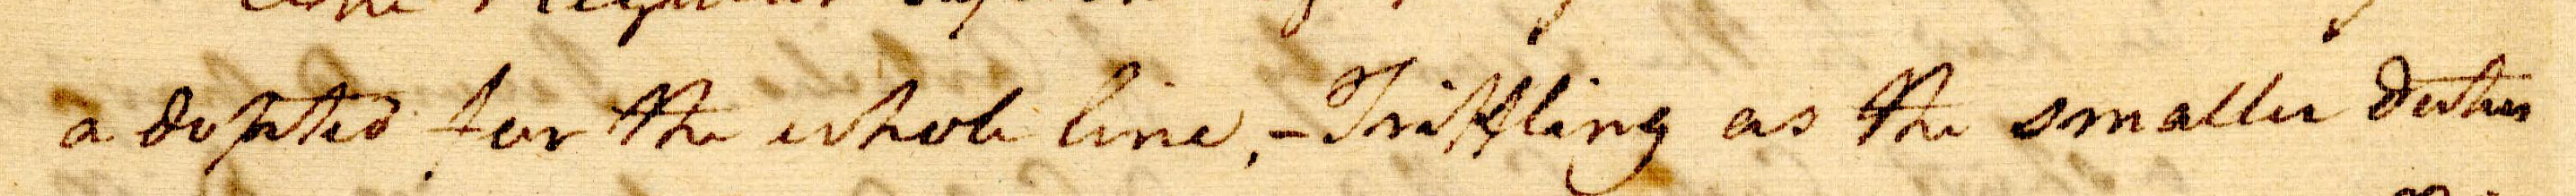adopted for the whole line,- Triffling as the smaller duties
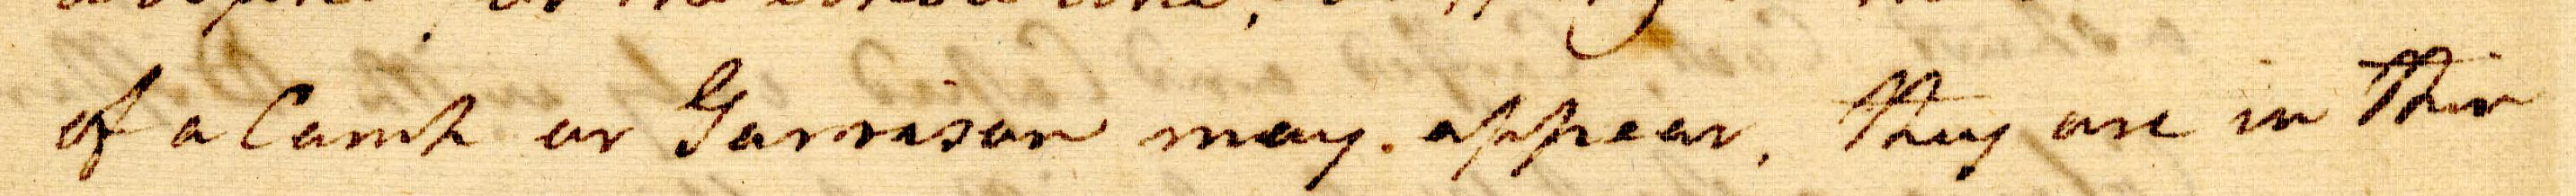of a Camp or Garrison may appear, they are in their
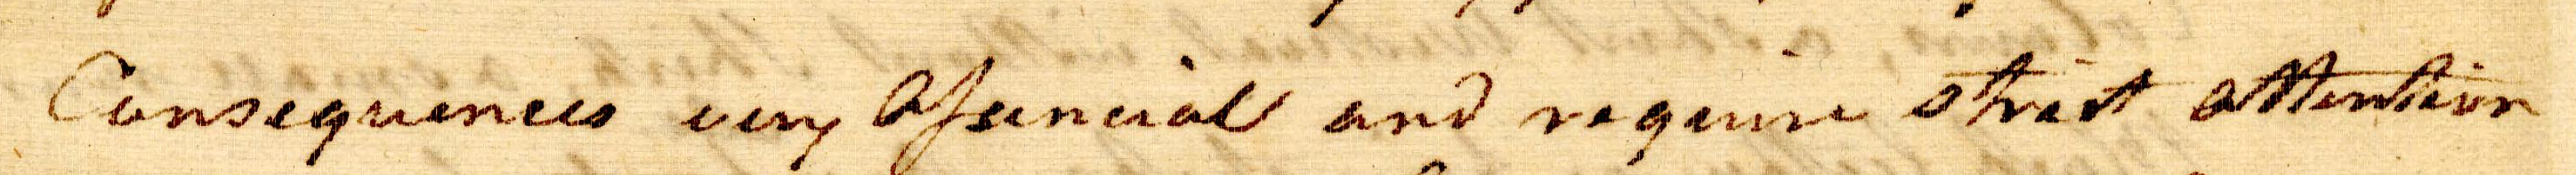Consequences very Assencial and require strict attention
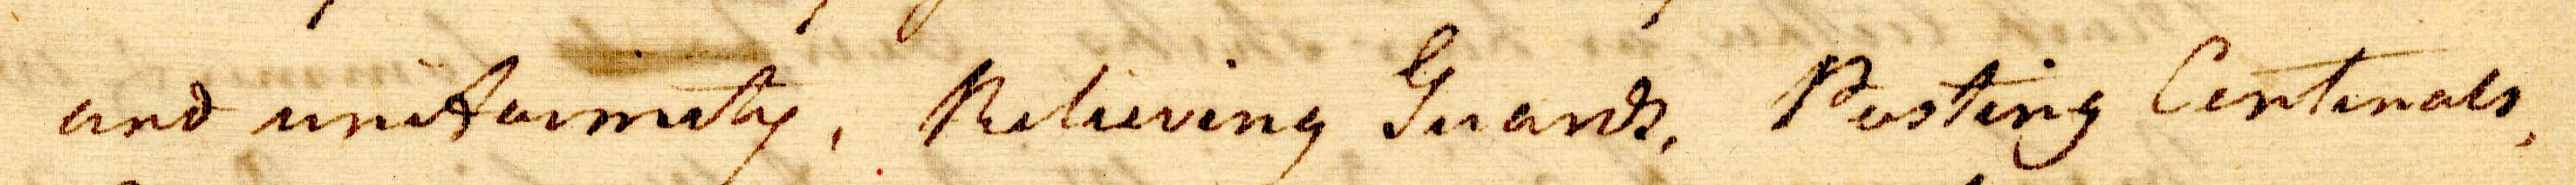and uniformity, Relieving Guards, Posting Centinals,
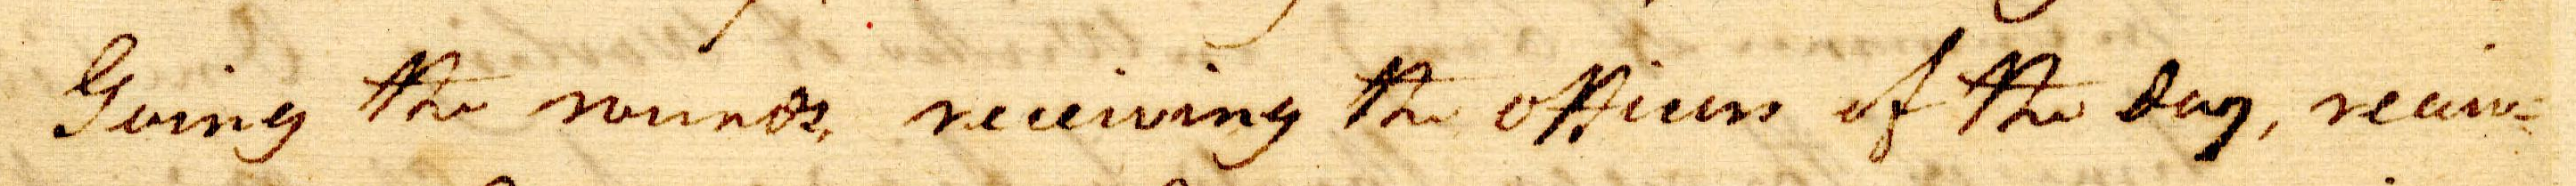Going the rounds, receiving the officers of the day, receiv-
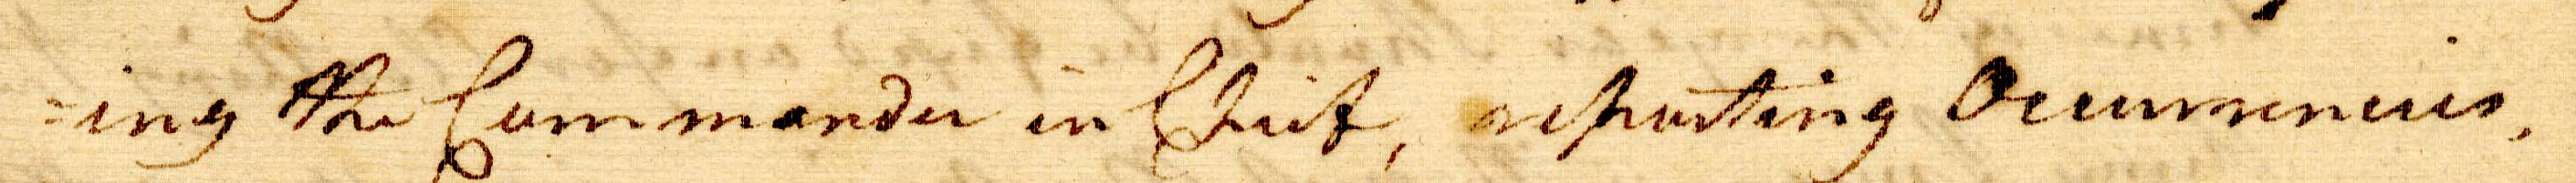-ing the Commander in Chief, reporting Occurrencies,
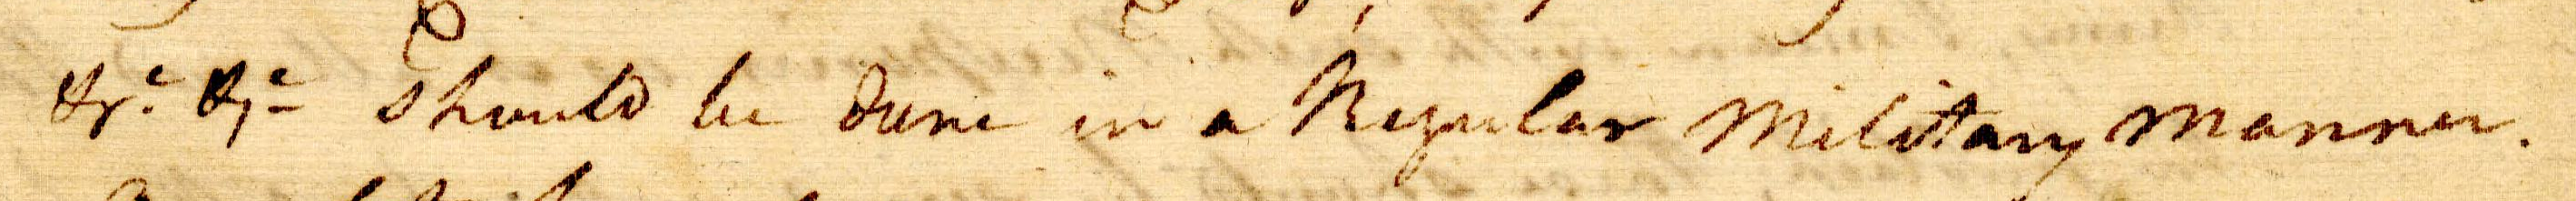&c^a. &c^a should be done in a Regular Military Manner.
